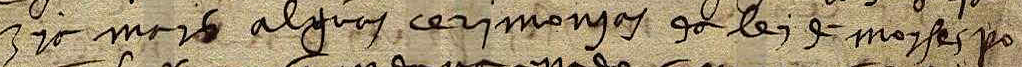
zya mays algūas cerjmonjas da ley de moyses po
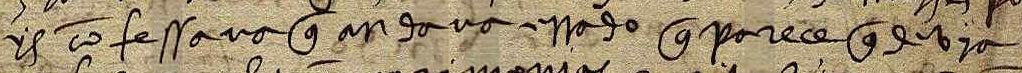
ys c̄ofessaua q̄ andaua errado q̄ parece q̄ devya
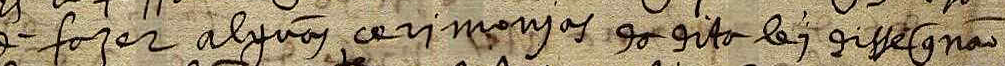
de fazer alguās cerjmonjas da dita ley disse q̄ não
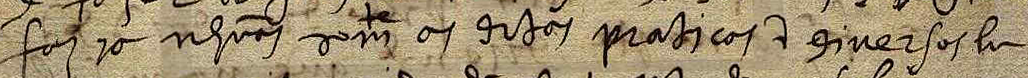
fazya nhūas somte as ditas pratycas ē diuersos lu
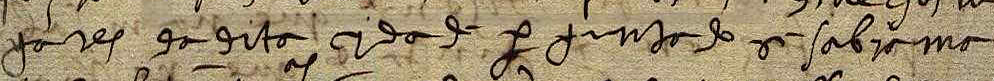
gares da dita cydade ꝑguntado se sabya ma
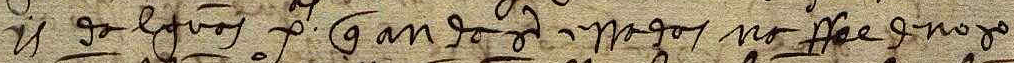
ys dalgūas pas q̄ andasē erradas na ffee de noso
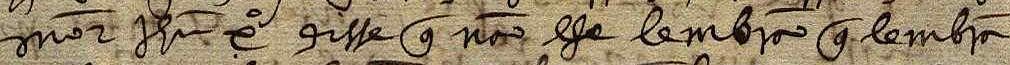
snōr Jhū xo disse q̄ não lhe lembrão q̄ lembrā
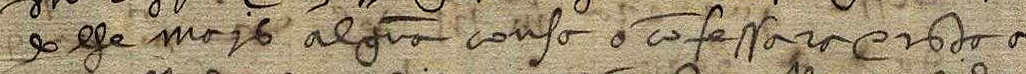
do lhe majs algūa cousa o c̄ofessara e esta a
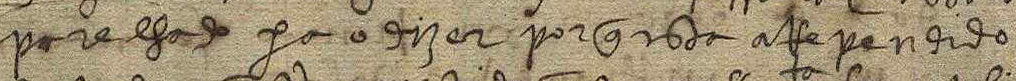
parelhado ꝑa o dyzer porq̄ esta aRependido
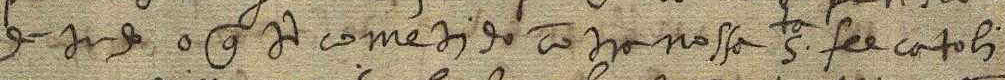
de tudo o q̄ tē cometjdo cōtra nossa S.ta fee catoli
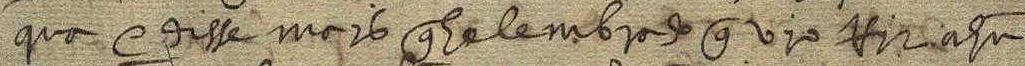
qua e disse mays q̄ he lembrado q̄ vyo Ryr a hū
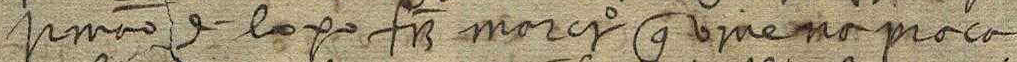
Jrmão de lopo frz̄ marcro q̄ vjue na praça
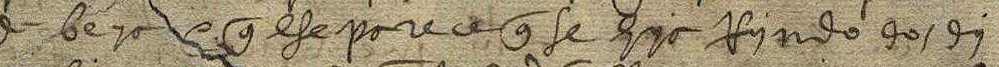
de beya e q̄ lhe parece q̄ se hya Ryndo dos dy
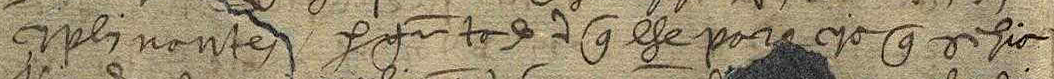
cyplynantes/ ꝑgūtado ē q̄ lhe parecya q̄ se hia
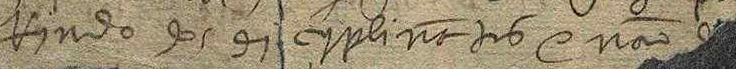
Ryndo dos dycyplinātes e não
